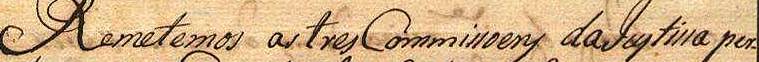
Remetemos a tres Commissoens da Iustissa per
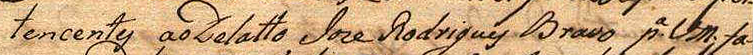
tencentes ao Delatto Ioze Rodrigues Bravo, p.a VM. fa
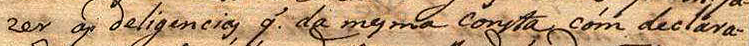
zer as deligencias, q̄ da mesma consta, com declara
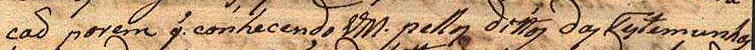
çaõ porem q̄ conhecendo VM. pellos dittos das Testemunhas
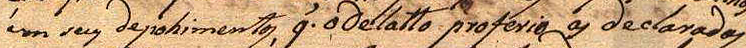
em seus depohimenttos, q̄ o Delatto proferio as declaradas
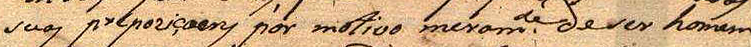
suas prepoziçoens por motivo meram.te de ser homem
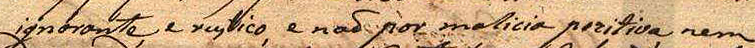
ignorante, e rustico, e naõ por malicia pozitiva, nem
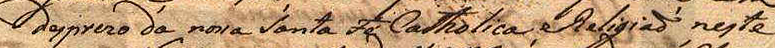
desprezo da nossa santa Fé Catholica, e Religiaõ neste
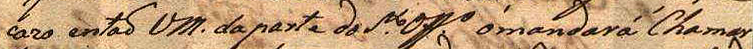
cazo então VM. da parte do S.to Off.o o mandará Chamar
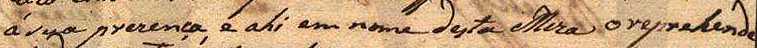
á sua prezença, e ahi em nome desta Meza o reprehende
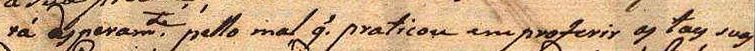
rá asperam.te pello mal q̄ praticou em proferir as taes suas
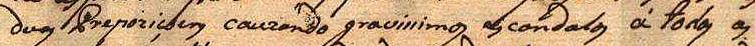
duas Prepoziçoens, cauzando gravissimos escandalos á todas as
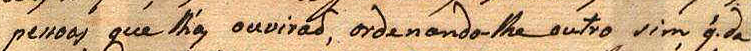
pessoas que lhas ouviraõ, ordenando-lhe outrosim, q̄ da
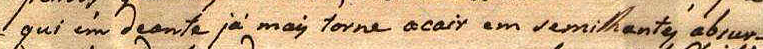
qui emdeante jámais torne a cair em semilhantes absur
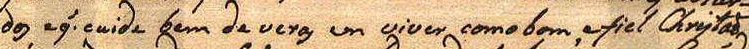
dos, e q̄ cuide bem deveras em viver como bom, e fiel Christaõ
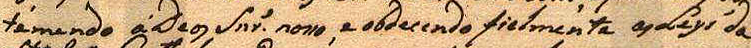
temendo á Deos Snr̄. nosso, e obdecendo fielmente as Leys da
